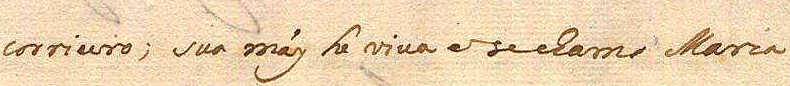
corrieiro; sua mãy he viua e se chama Maria
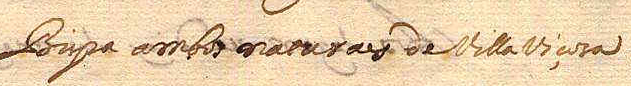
Bispa ambos naturaes de Villa Viçosa
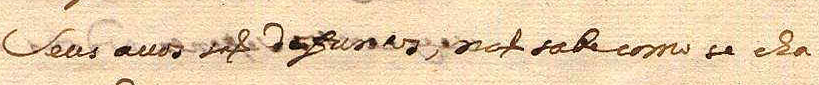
Seus auos saõ defuntos, naõ sabe como se cha
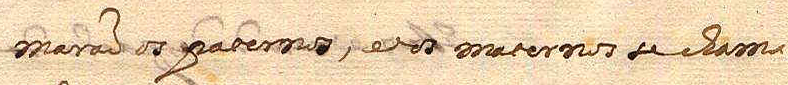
maraõ os paternos, e os maternos se chama
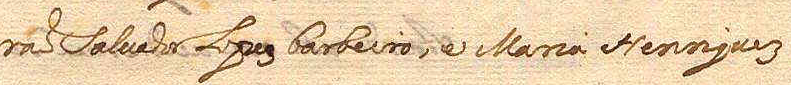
raõ Saluador Lopez barbeiro, e Maria Henriquez
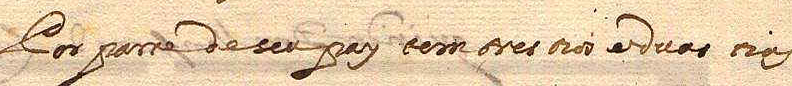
Por parte de seu pay tem tres tios e duas tias
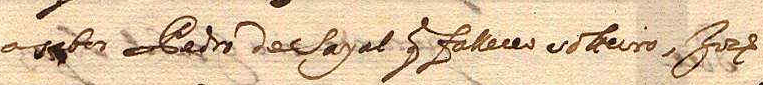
a saber Pedro de Sayal q̄ falleceo solteiro, Joaõ
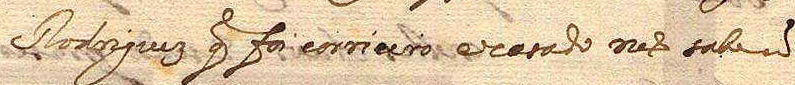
Rodriguez q̄ foi corrieiro e casado naõ sabe cō
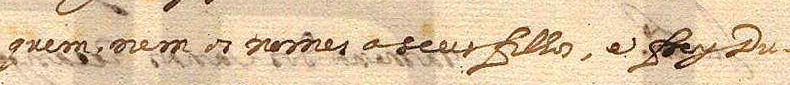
quem, nem os nomes a seus filhos, e frey Du
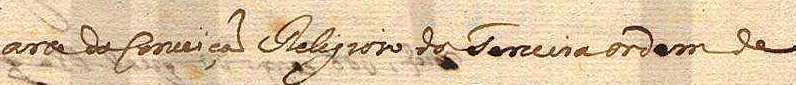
arte da Conceiçaõ Religioso da Terceira ordem de
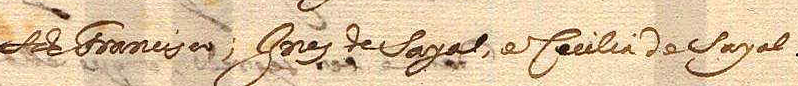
Saõ Francisco; Jnes de Sayal, e Cecilia de Sayal.
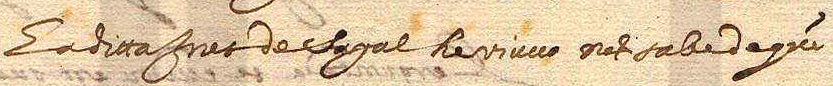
E a ditta Jnes de Sayal he viuua naõ sabe de quē
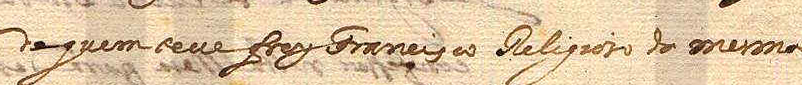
de quem teue frey Francisco Religioso da mesma
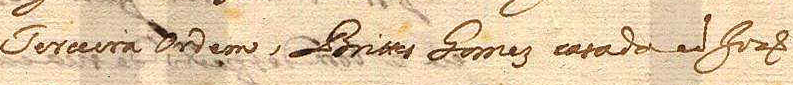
Terceira Ordem, Brittes Gomez casada cō Joaõ
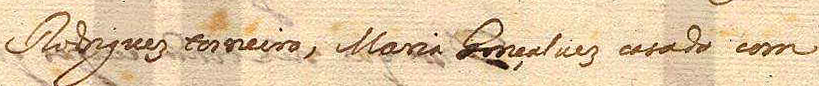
Rodriguez torneiro, Maria Gonçaluez casada com
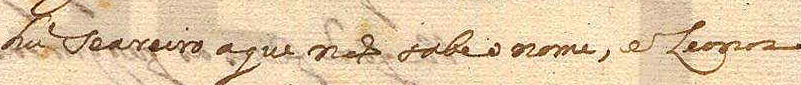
hū Seareiro a que naõ sabe o nome, e Leonor
